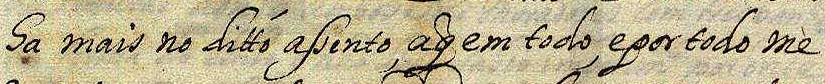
ha mais no ditto assento, a q̄ em todo, e por todo me
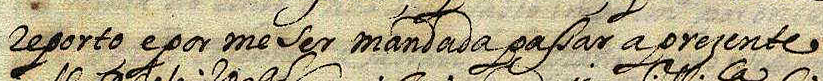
reporto, e por me ser mandada passar a prezente
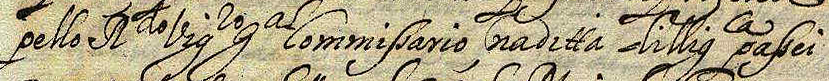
pello Rdo Vigro Gal Commissario na ditta dillig.ca passei
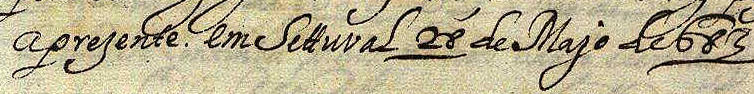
a prezente em Settuval 28 de Majo de 683
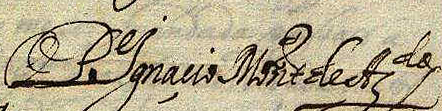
O Pe Ignacio Mont̄ de Azdo
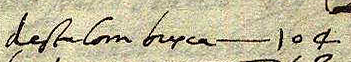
desta com busca - 104
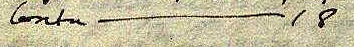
conta - 18
